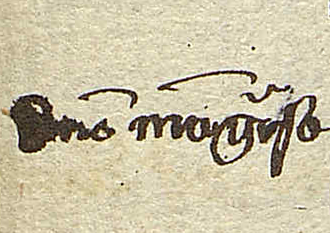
d*no mag*if*o
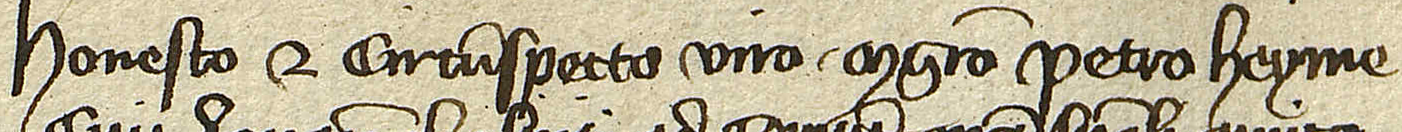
Honeſto et Circu*ſpecto viro / M*g*ro Petro Heyme
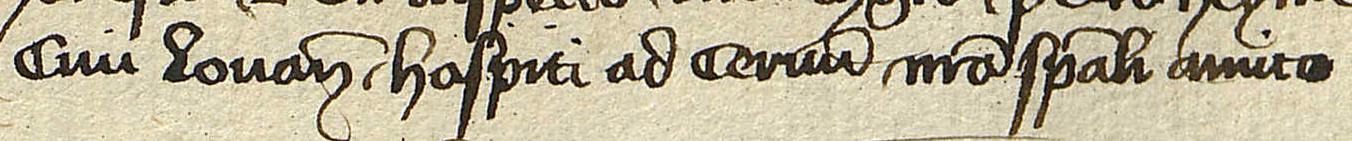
Ciui Louan* / hoſpiti ad Ceruum n*ro ſp*ali amico
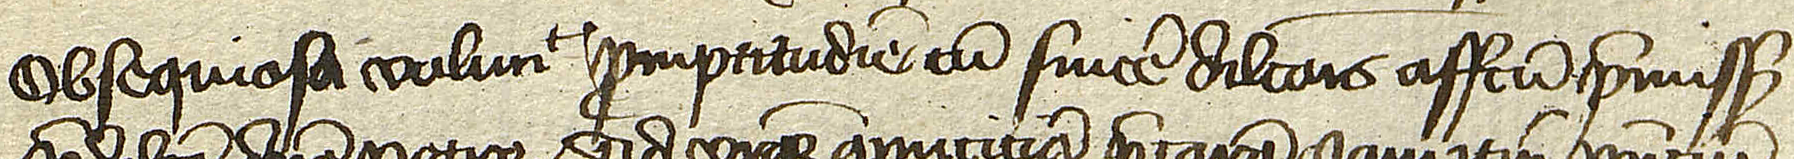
Obſequioſa volunt* p*mptitudi*e cum ſince* dil*c*on*s aff*tu* p*miſſ*
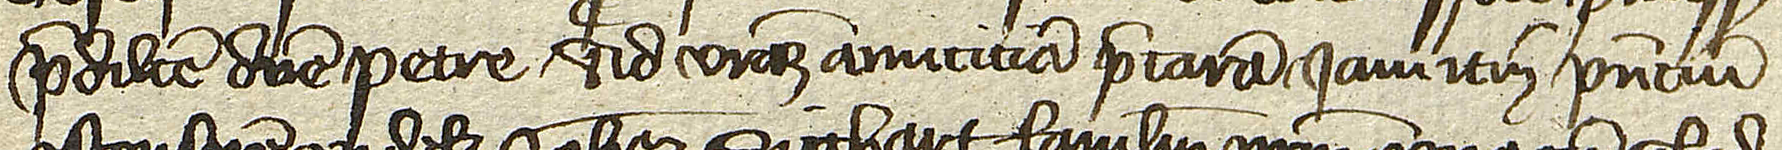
p*dil*te d*ne Petre / ad v*ra* amicitia* p*clara* / Iam it*m p*nt*m
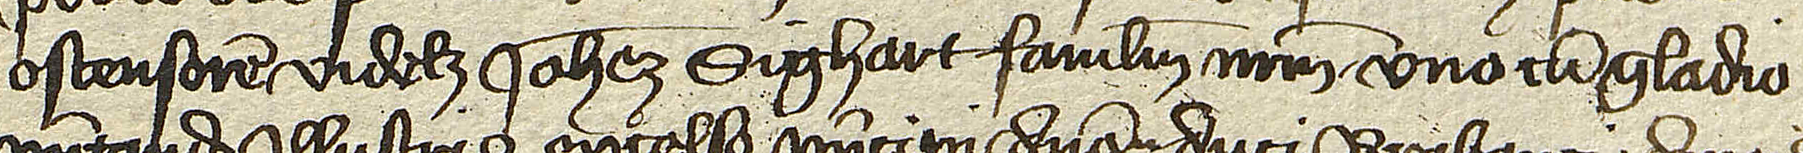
oſtenſore* videl* Ioh*e* Sighart fam*m n*r*m / vno cu* gladio
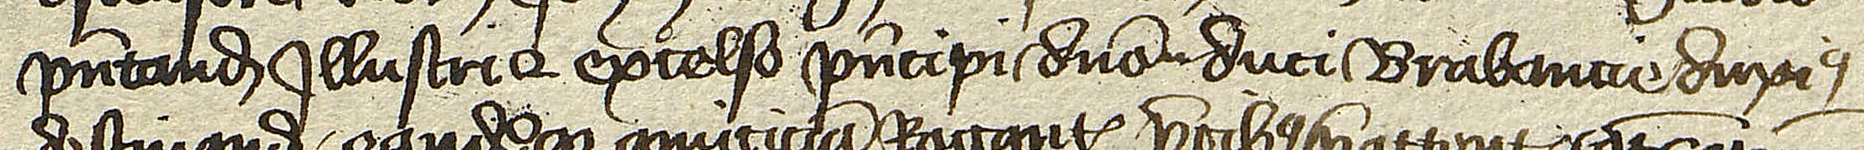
p*ntand* Illuſtri @ excelſo p*ncipi / d*no ~ duci Brabantie duxi*
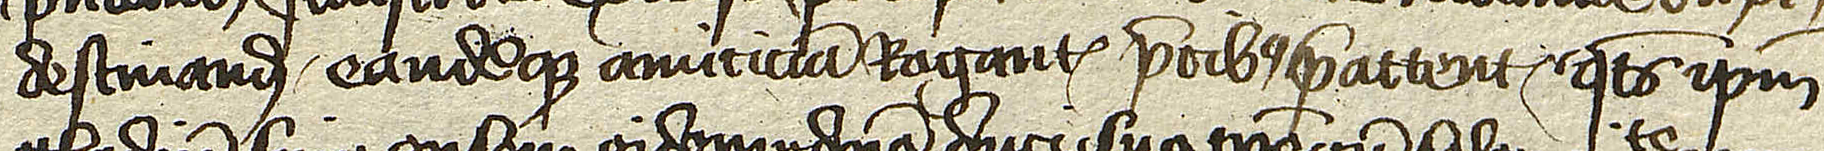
destinand* / eande*q* amicitia* Rogant* p*cib* p*attent* / q*t*s ip*m
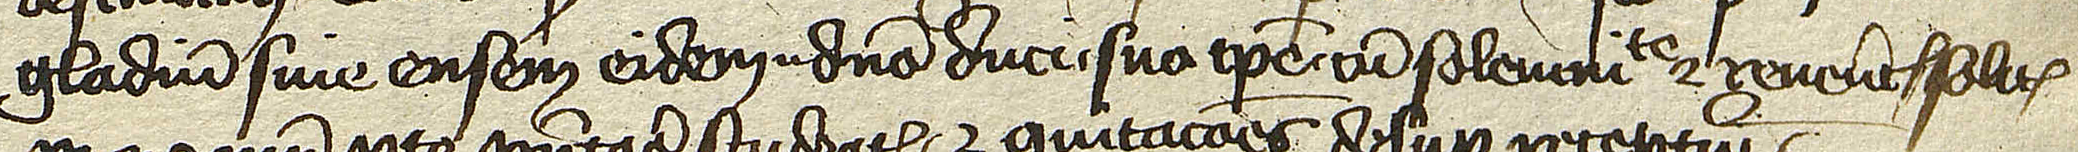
gladiu* ſiue enſem eidem ~ d*no duci ſuo t*p*e / cu* ſolemni*te @ reue*nt* ſolit*
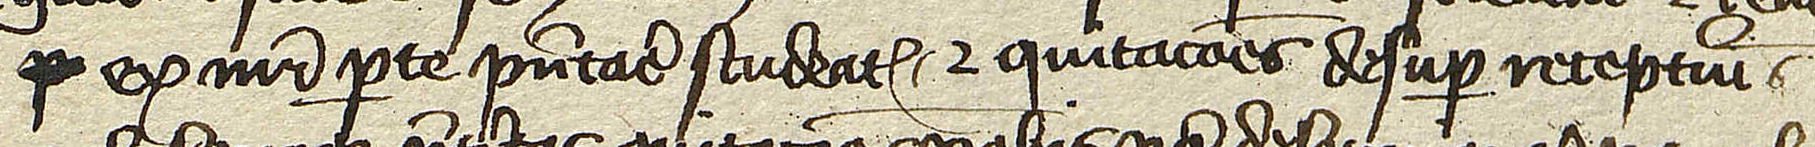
p ex nri* p*te p*nta*e ſtudeat* / @ quitac*o*es deſup* receptu* /
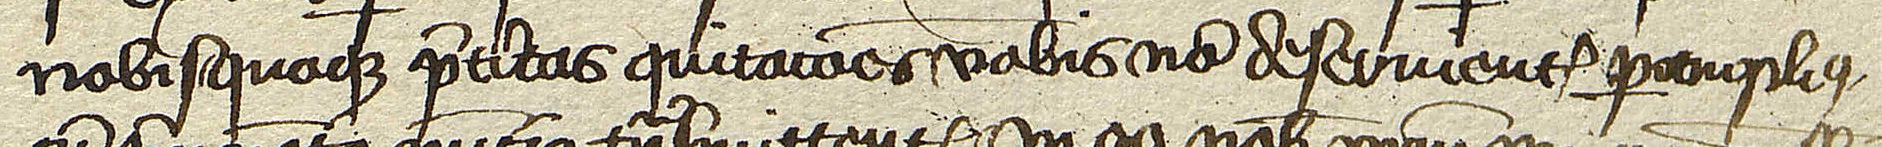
nobiſ quoq* quitac*o*es vobis no* deſeruient* p*ampli* /
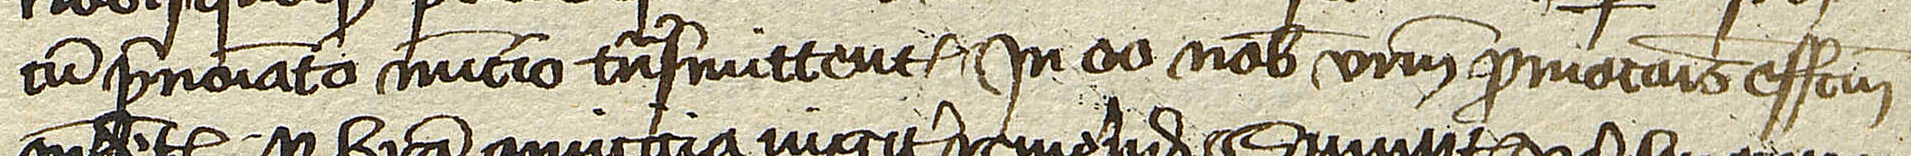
cu* p*n*i*ato nu*cio t*nſmittent* / In eo nob* v*r*m p*moto*is eff*c*m
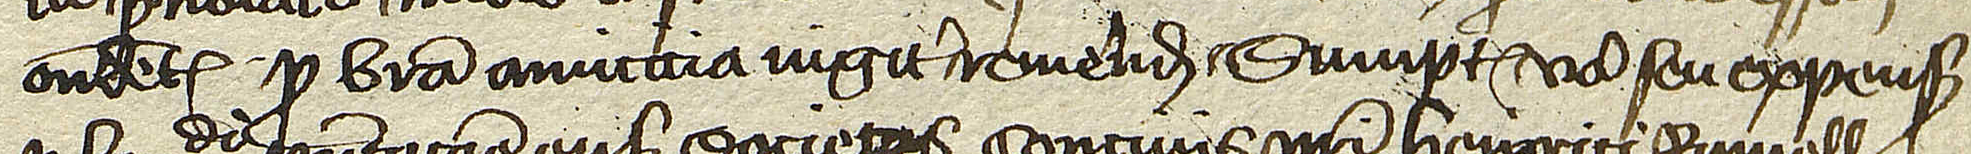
o*ndet* p* v*ra amicitia iugit* reme*nd* / Sumpt* v*a ſeu expenſ*
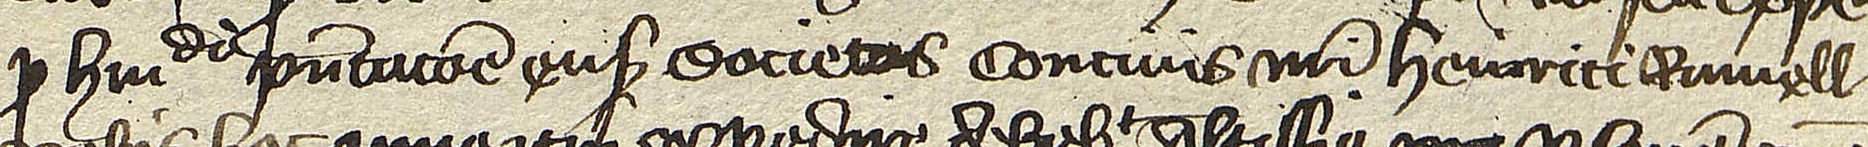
p* h*m*di p*ntat*o*e enſ* Societas Conciuis n*ri Heinrici Rumell
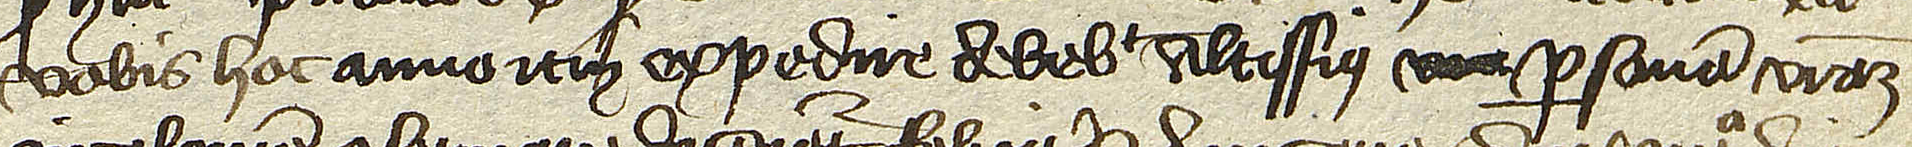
vobis hoc anno it*m expedire debeb*t / Altiſſi* %% p*ſona* v*ra*
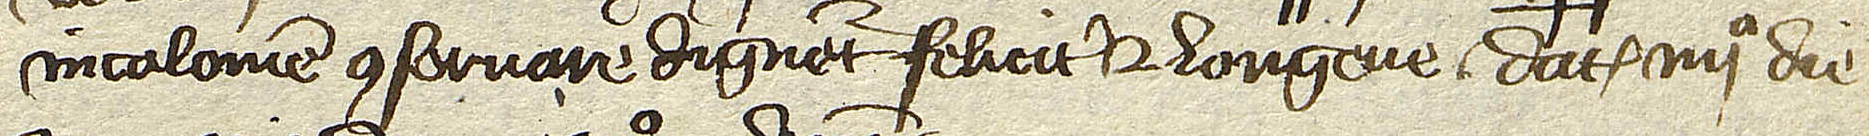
incolome* *ſeruare dignet* felicit* @ longeue / Dat* iiii* die
